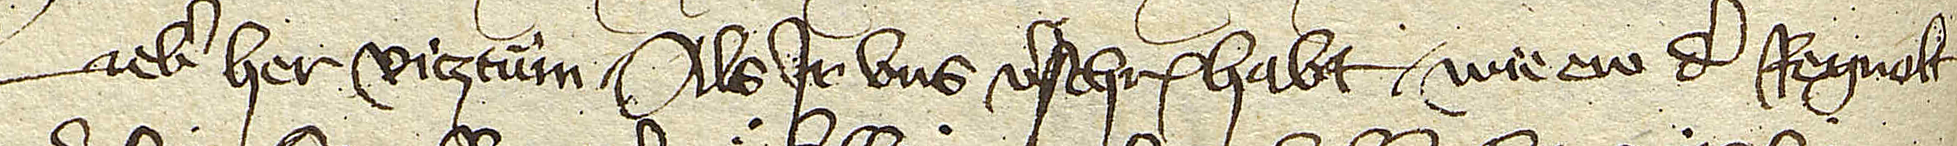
Lieb* her vicʒtüm / Als Ir vns v*ſchr* habt / wie ew d* Regnolt
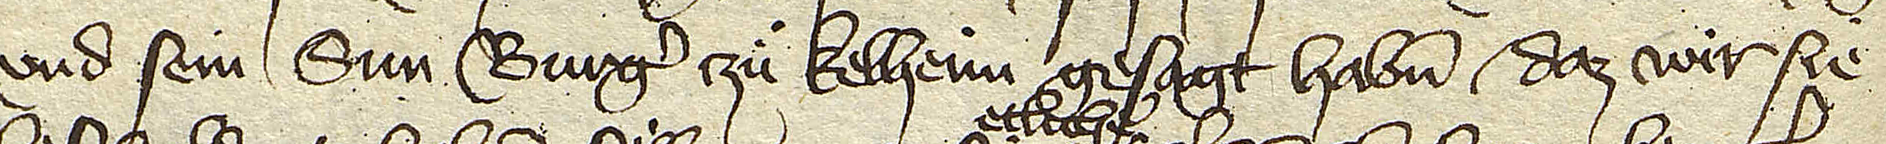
vnd ſein Sun Burg* cʒü kelheim geſagt habn* / daʒ wir ſie
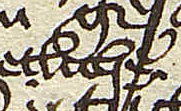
etliche*
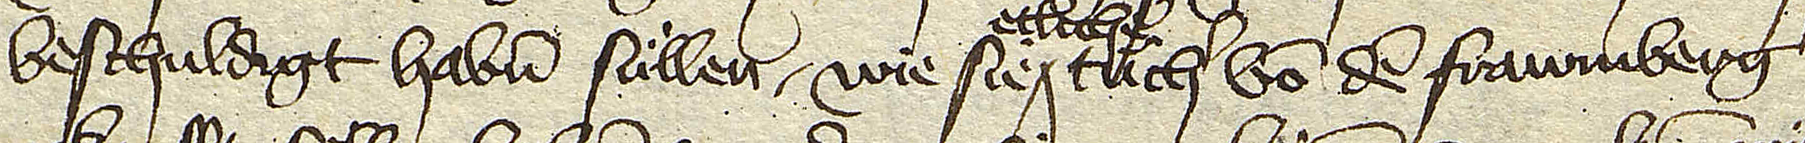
beſchuldigt habn* ſüllen / wie ſie tüch* vo* d* frawmberg*
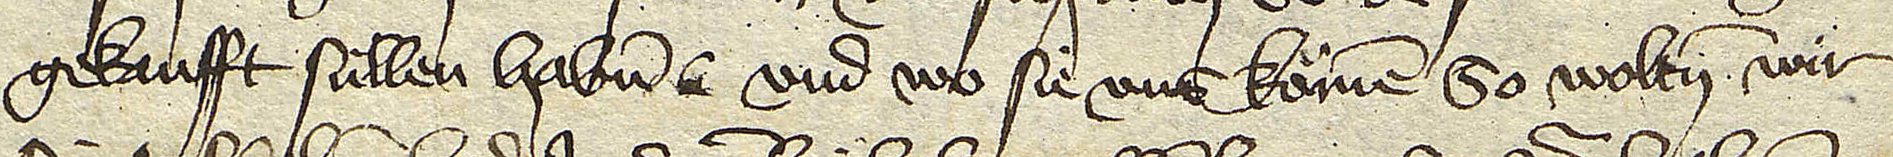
gekaufft ſüllen habn* / vnd wo ſie vns köme* So woltn* wir
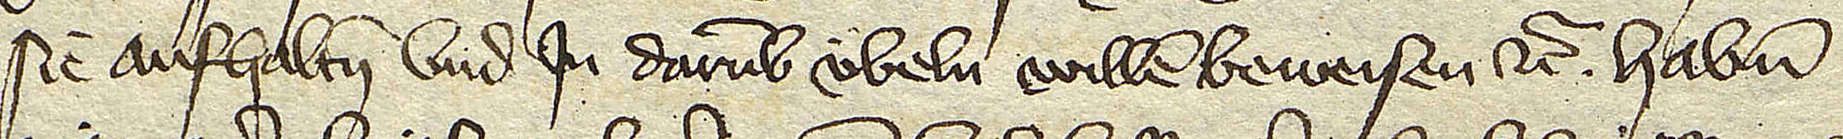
ſie aufhaltn* vnd In darub* v̈beln wille* beweiſen ec* . habn*
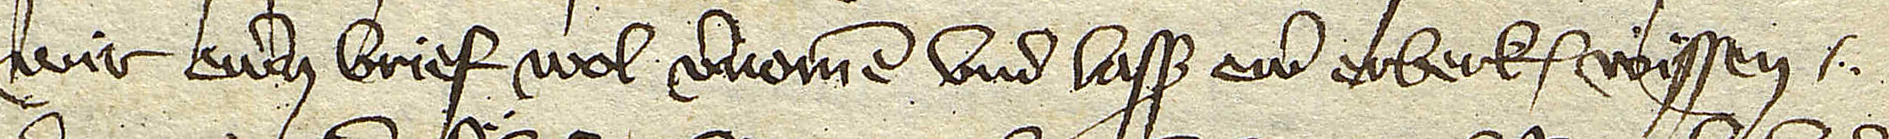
wir ew*n brief wol v*nome* vnd laſſ* ew* erberk* wiſſen / .
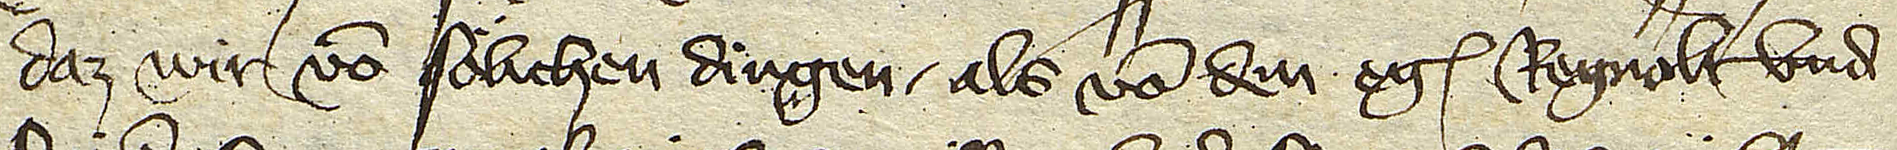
daʒ wir vo* ſölichen dingen / als vo* den eg* Regnolt vnd
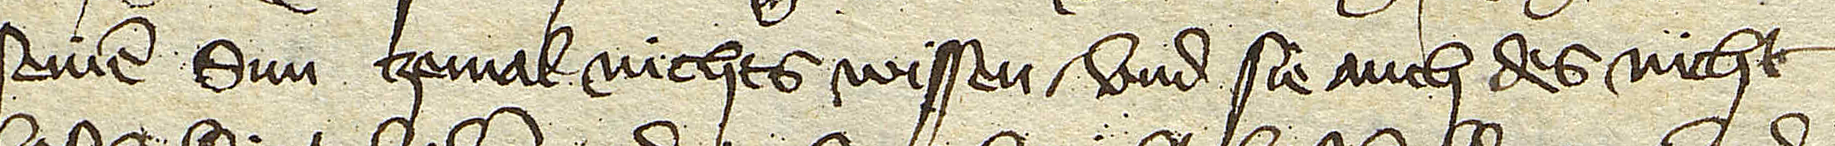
ſeine* Sun cʒemal nichts wiſſen / vnd ſie auch des nicht
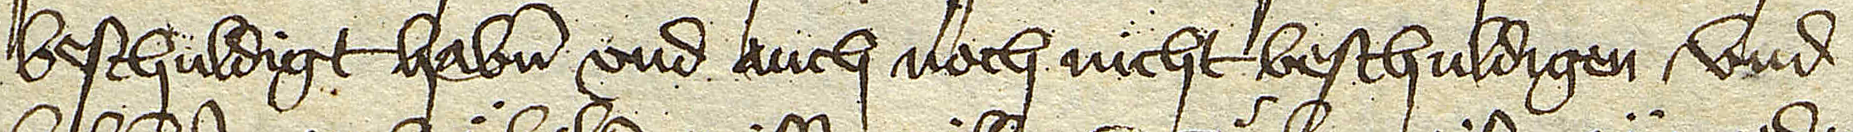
beſchuldigt habn* vnd auch noch nicht beſchuldigen / vnd
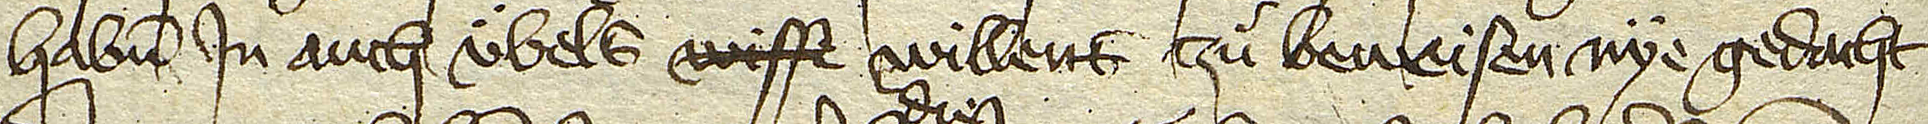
habn* In auch v̈bels wiſſe willens cʒü beweiſen nye gedacht
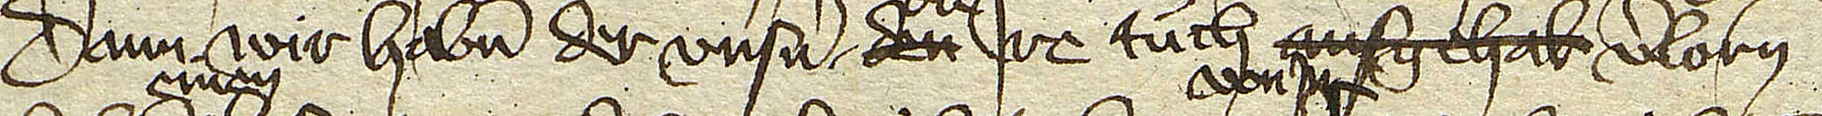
Dann wir habn* der vnſn* / den Ire tüch aufgehal v*lorn*
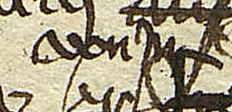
von In
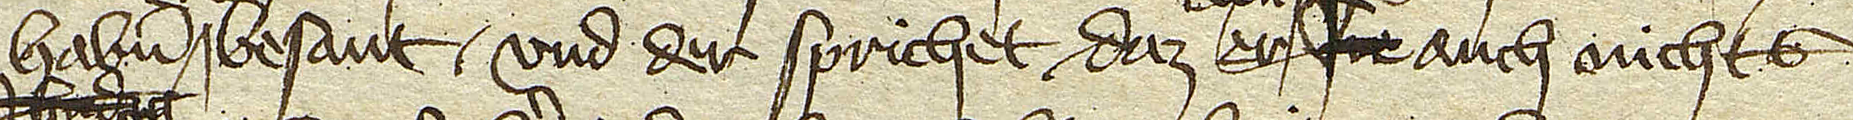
habn* beſant / vnd der ſprichet / daʒ er ſie auch nichts
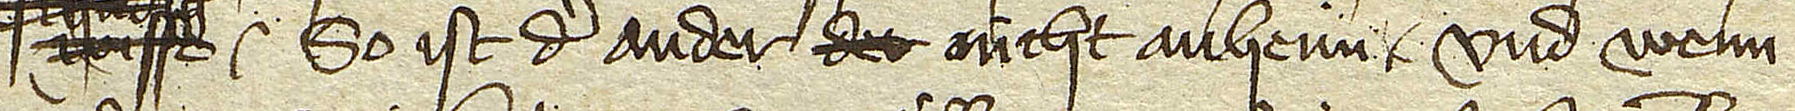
wiſſe* / So iſt d* ander der nicht anheim / vnd wenn
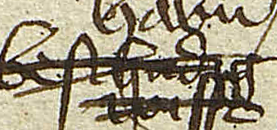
beſchudig
